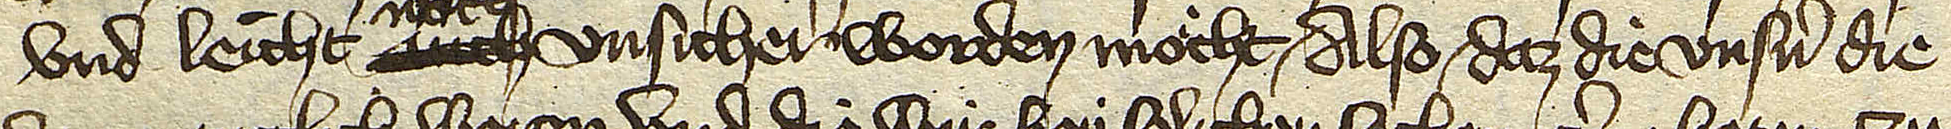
vnd leicht auch vnſicher worden möcht / Alſo / daʒ die vnſn* die
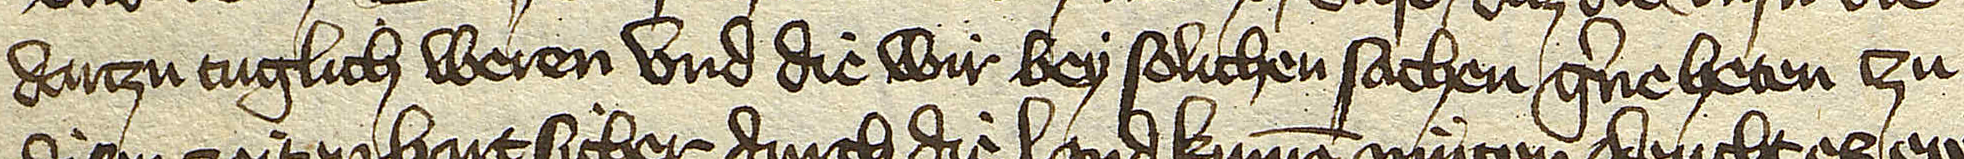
darcʒu tuglich weren vnd die wir bey ſolichen ſachen g*ne heten cʒu
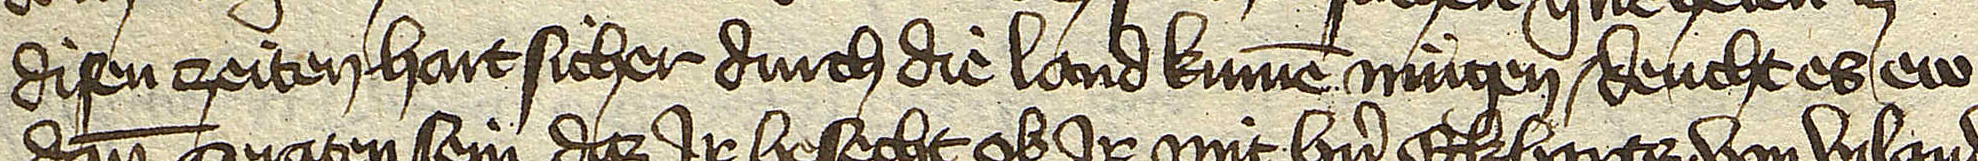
diſen cʒeiten hart ſicher durch die land kume* mügen / deucht es ew
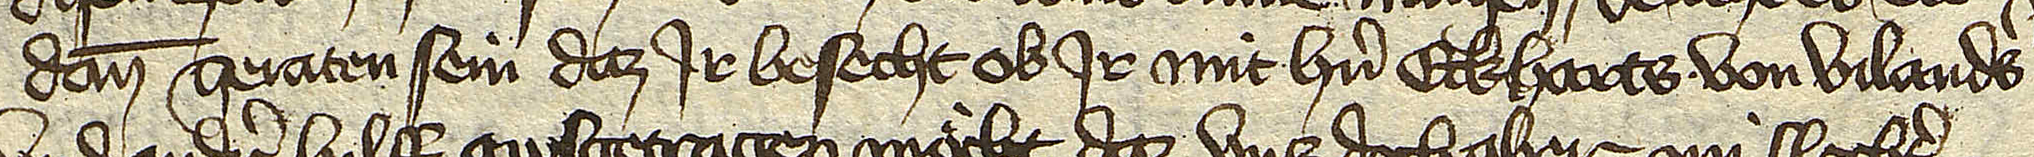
dan* geraten ſein daʒ Ir beſecht ob Ir mit hn* Eckharts von vilands*
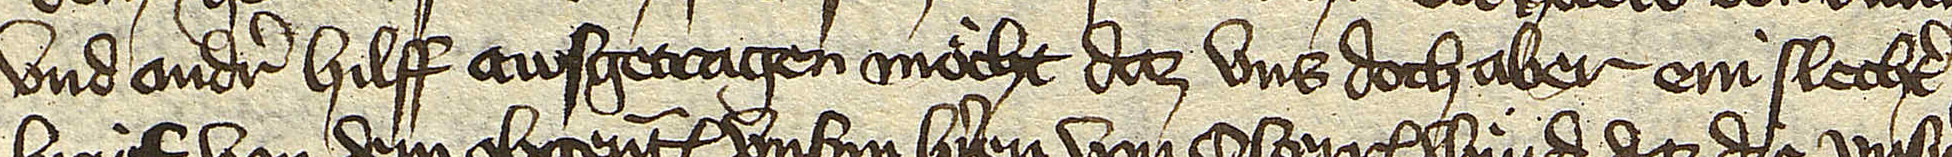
vnd andr* hilff awſgetragen möcht daʒ vns doch aber ein ſlecht*
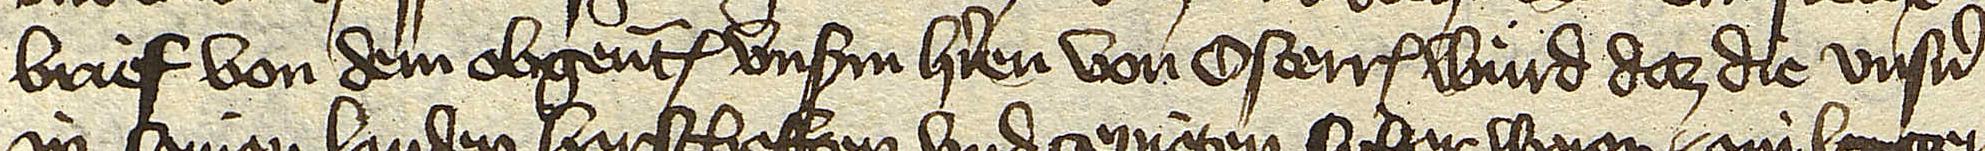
brief von dem obgent* vnſ*m hr*en von Oſterr* würd daʒ die vnſn*
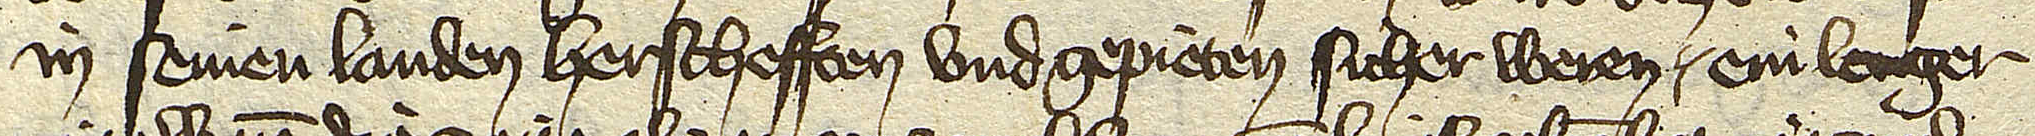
in ſeinen landen gerſchefften vnd gepieten ſicher weren / ein lenger
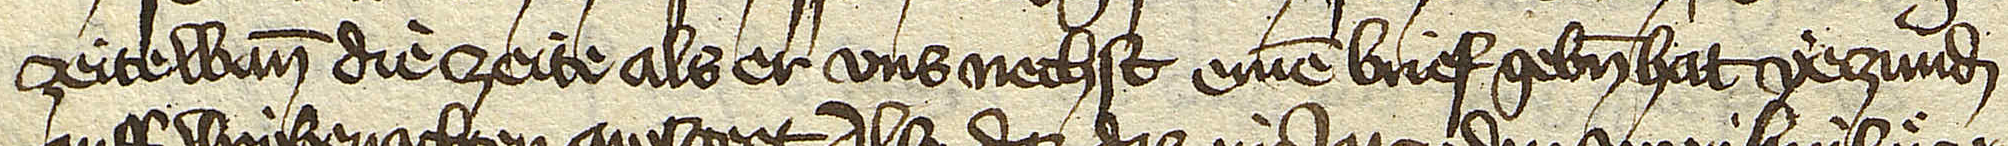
cʒeite wan* die cʒeite als er vns nechſt eine* brief gebn* hat yecʒund*
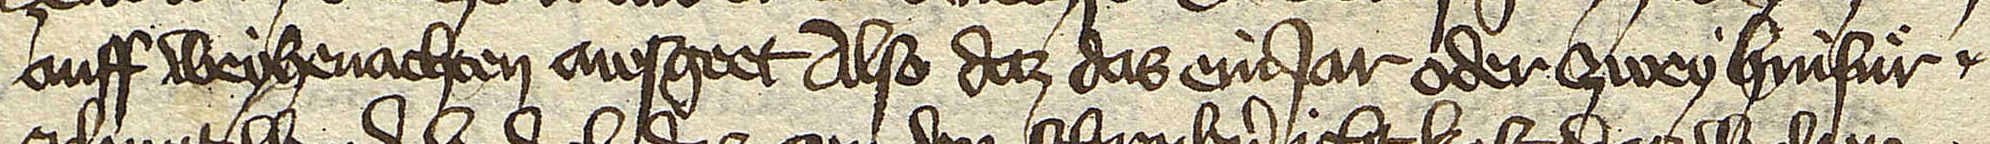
auff weyhenachten awſgeet Alſo daʒ das ein Iar oder cʒwey hinfür %
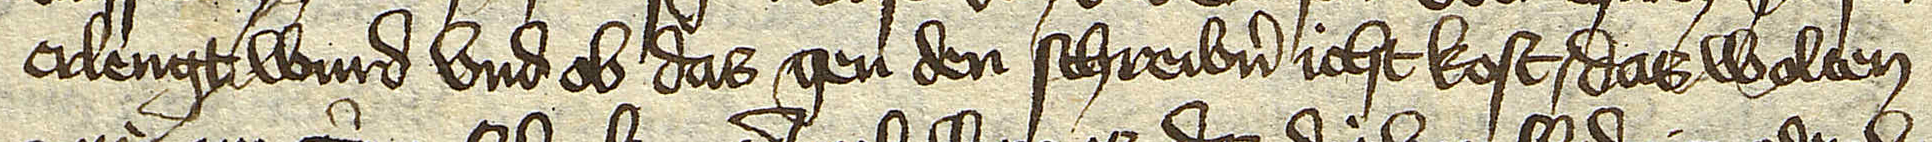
erlengt wurd vnd ob das gen den ſchreibn* icht koſt / das wolten
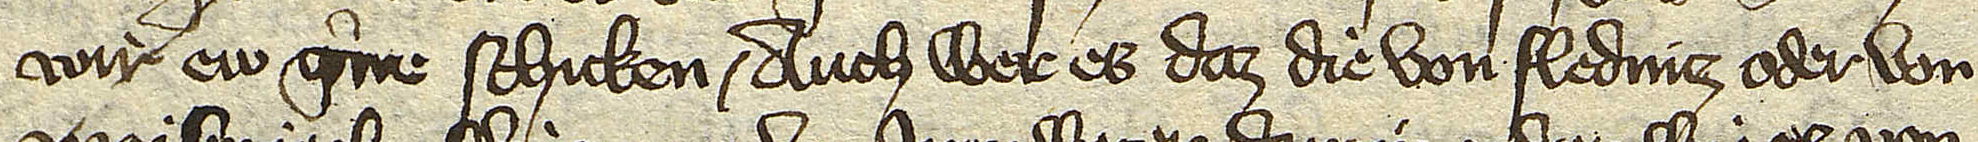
wir ew g*ne ſchicken / Auch wer es daʒ die von flednicʒ oder von
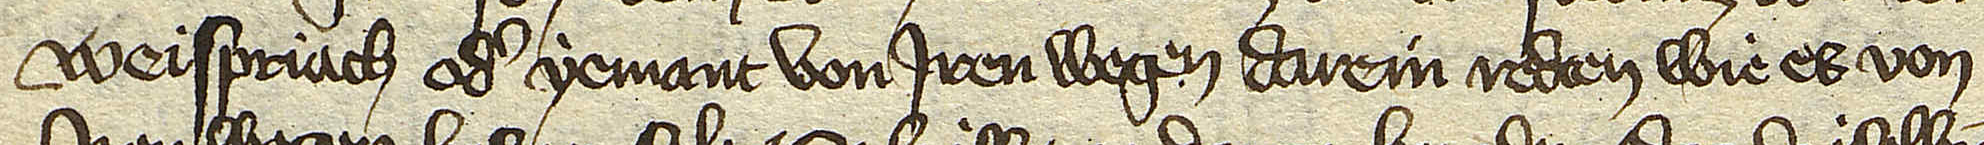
weiſpriach od* yemant von Iren wegen darein reden wie es von
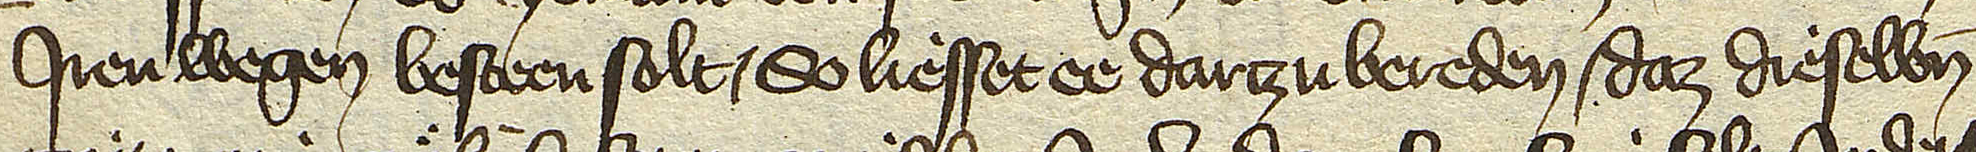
Iren wegen beſteen ſolt / So lieſſet ee darʒu bereden / daʒ dieſelbn*
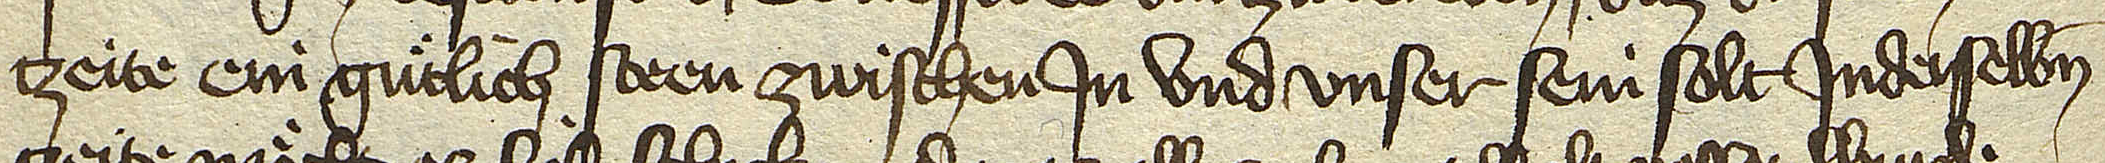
cʒeite ein gütlich ſteen cʒwiſchen In vnd vnſer ſein ſolt Inderſelbn*
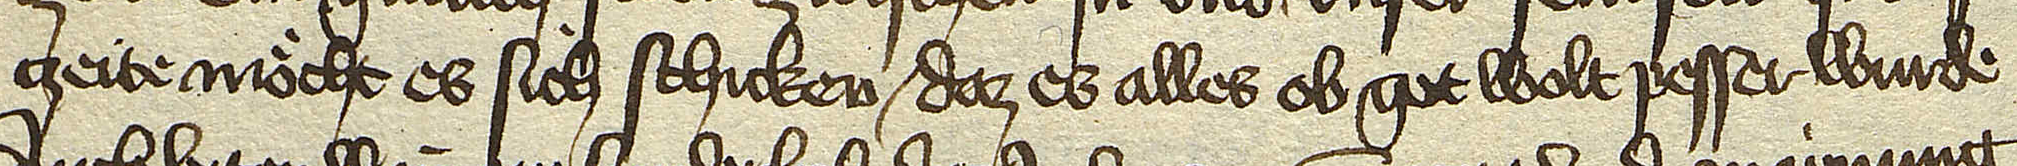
cʒeite möcht es ſich ſchicken / daʒ es alles ob gut wolt peſſer wurde
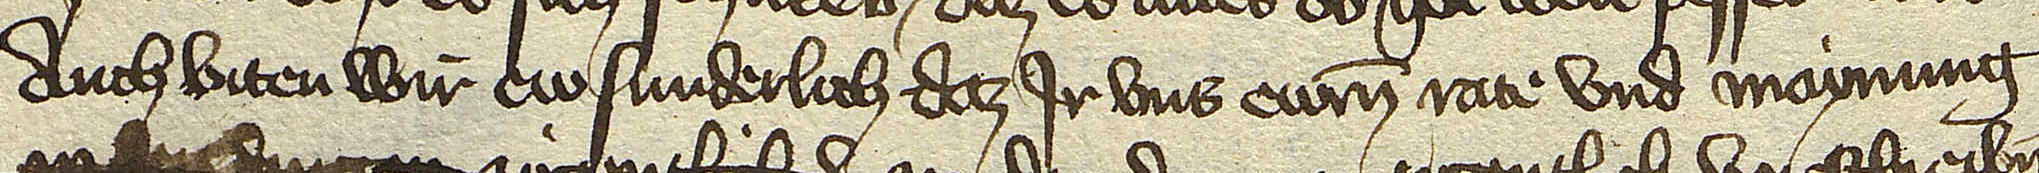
Auch biten wir ew ſunderlich daʒ Ir vns ewrn* rate vnd maynung
